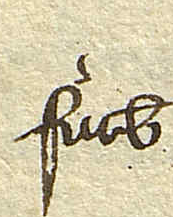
fürb*
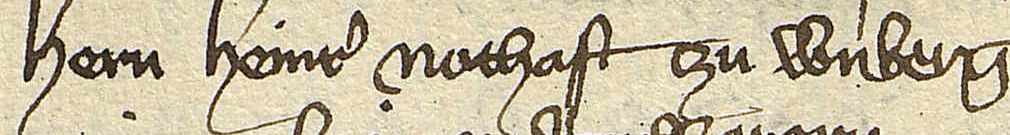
hern heinr* Nothaft cʒu wn*berg
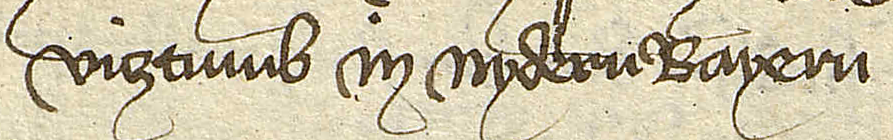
vicʒtumb in Nydern Bayern
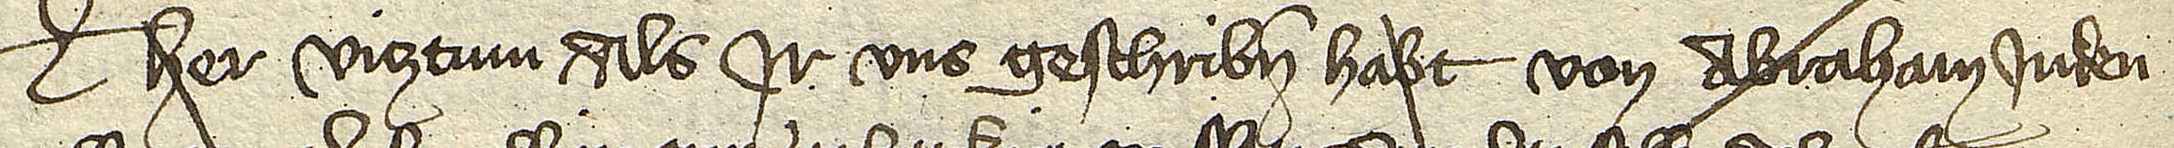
L* her vicʒtum / Als Ir vns geſchribn* habt von Abraham Iuden
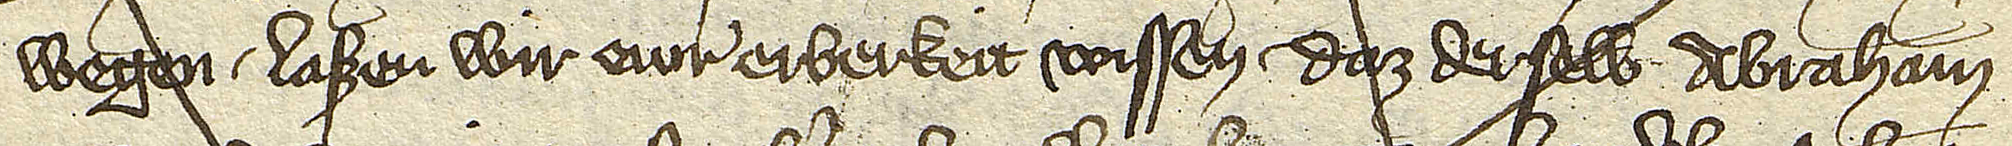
wegen / laſʒen wir ewr* erberkeit wiſſen / daʒ derſelb Abraham
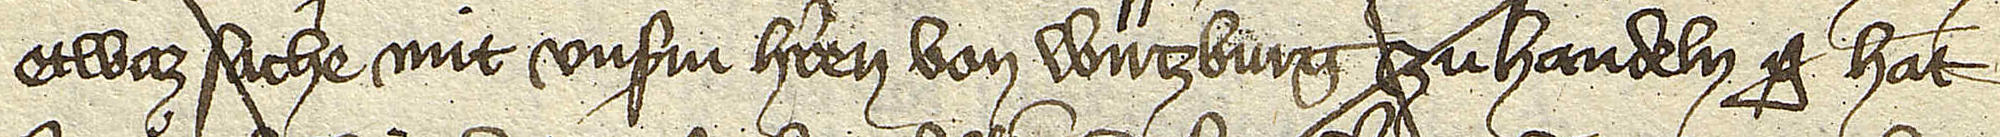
etwaʒ ſache mit vnſ*m hr*en von wircʒburg cʒu handeln g hat
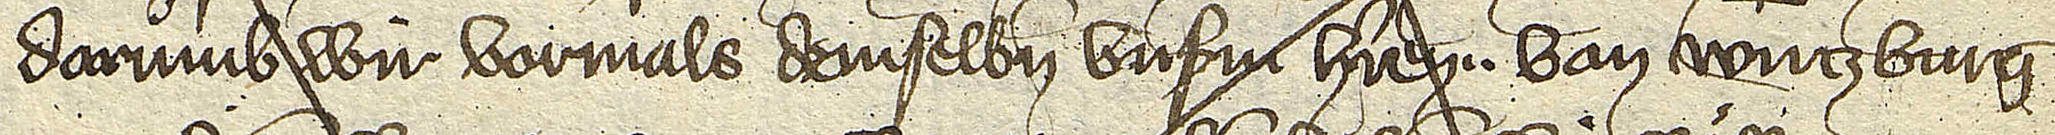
darümb wir vormals demſelbn* vnſ*m hr*en ~ von wircʒburg
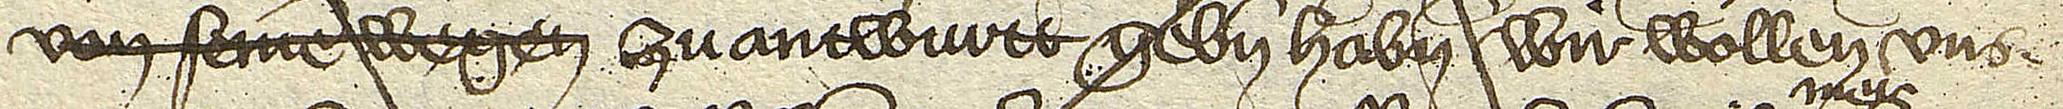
von ſeine* wegen cʒu antwurt gebn* habn* / wir wöllen vns
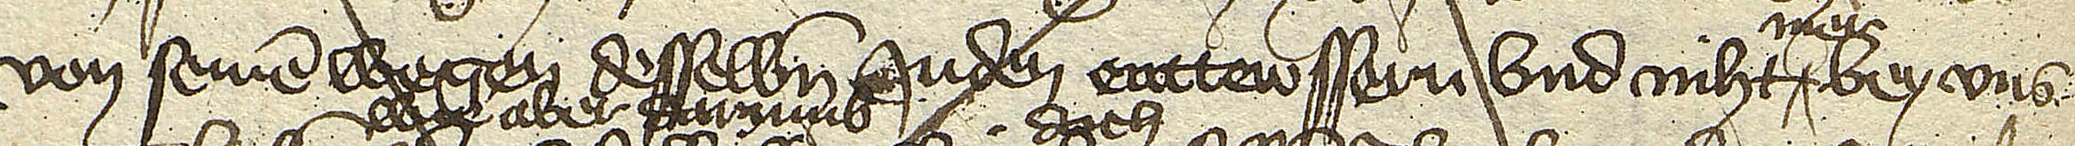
von ſeine* wegen deſſelbn* Iuden enttewſſern vnd niht bey vns
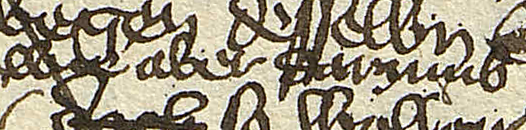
wie aber darumb
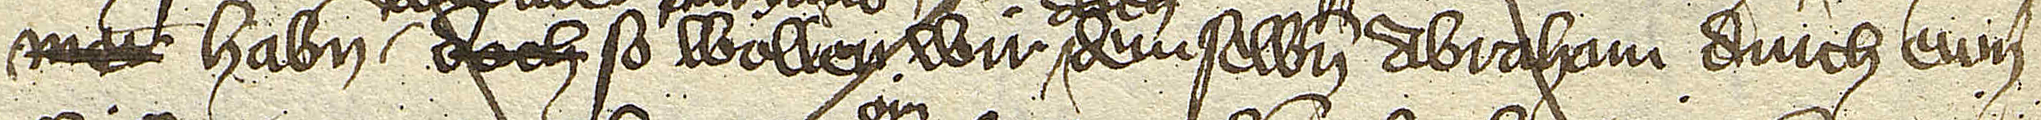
mer habn* / doch ſo wöllen wir demſelbn* Abraham durch ewn*
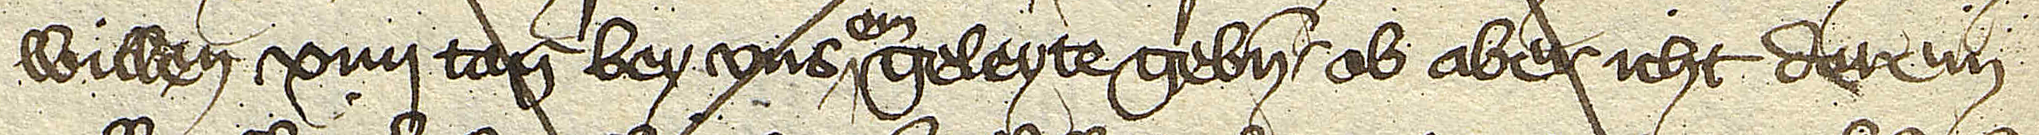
willen xiiii tag bey vns geleyte gebn* / ob aber icht darein
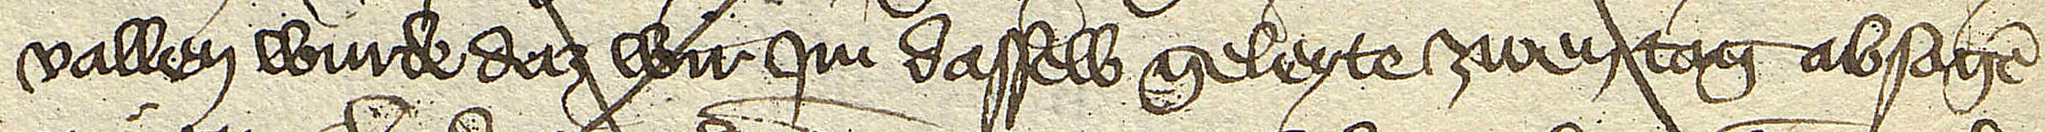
vallen würde daʒ wir Im daſſelb geleyte cʒwen tag abſage*
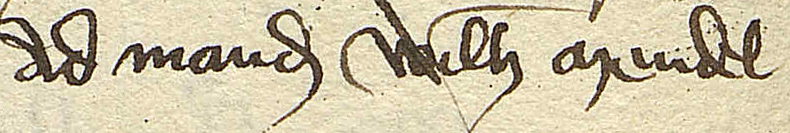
Ad mand wilh* Mendel
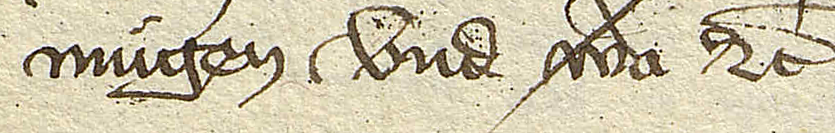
mügen / vnd wo ec*
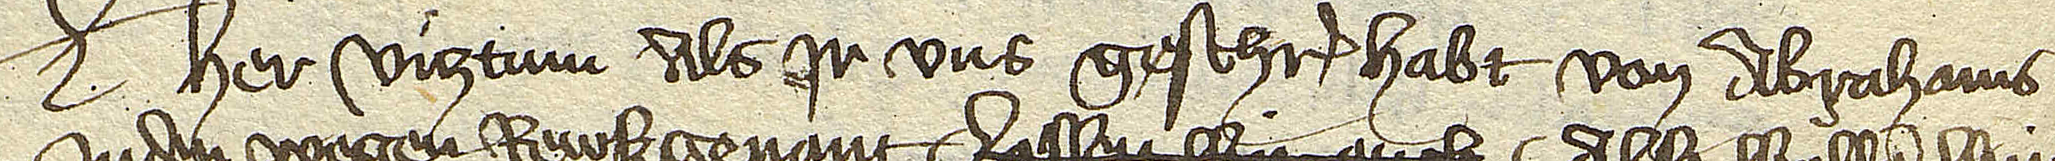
L* her vicʒtum Als Ir vns geſchr* habt von Abrahams
